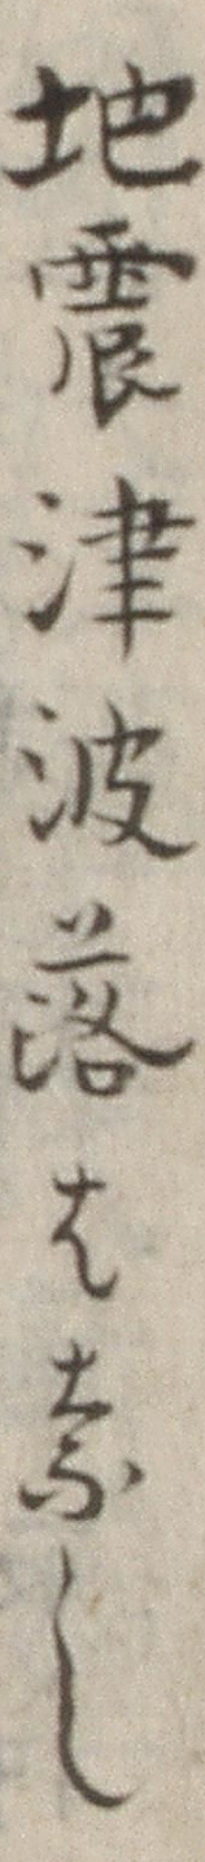地震津波落はなし
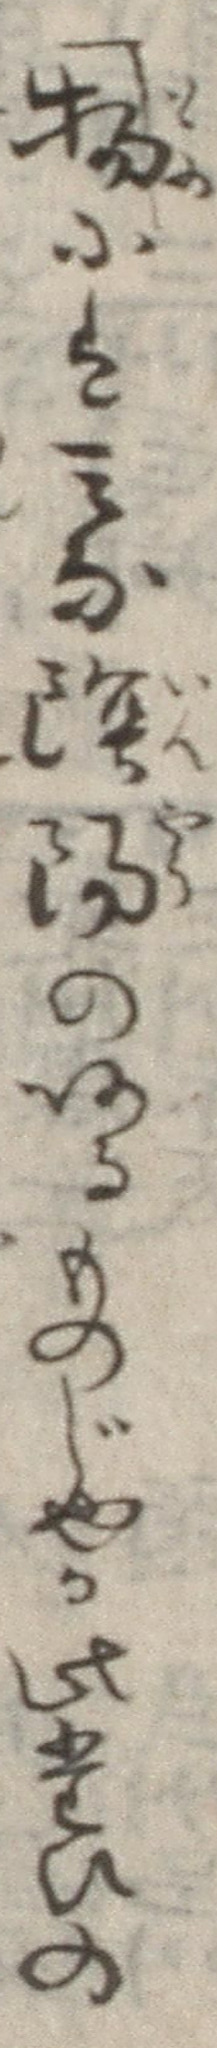〽物にはみな陰陽のあるものじやか此たひの
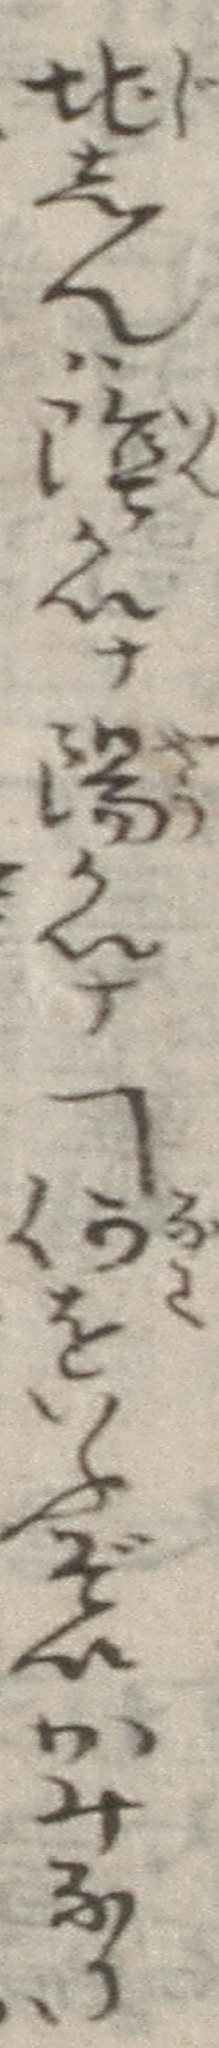地じんは陰かいナ陽かいナ〽何をいふぞいかみなりは
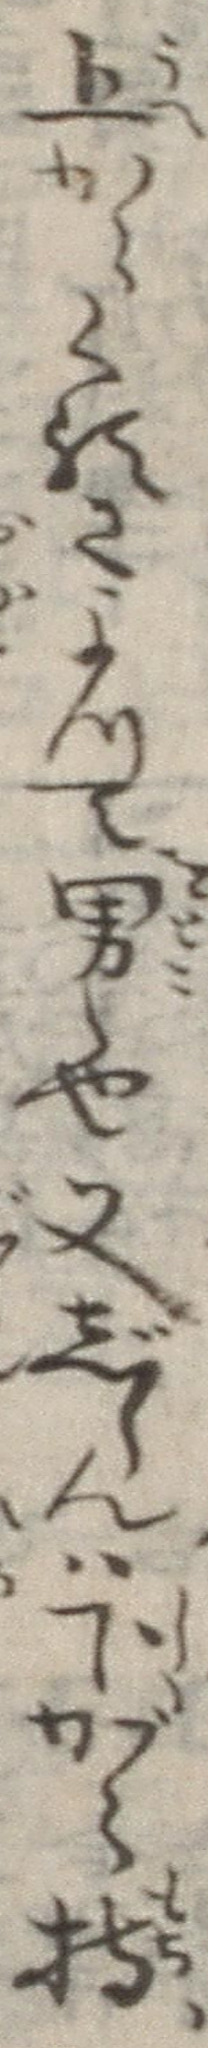上からくるによつて男しや又じしんは下から持
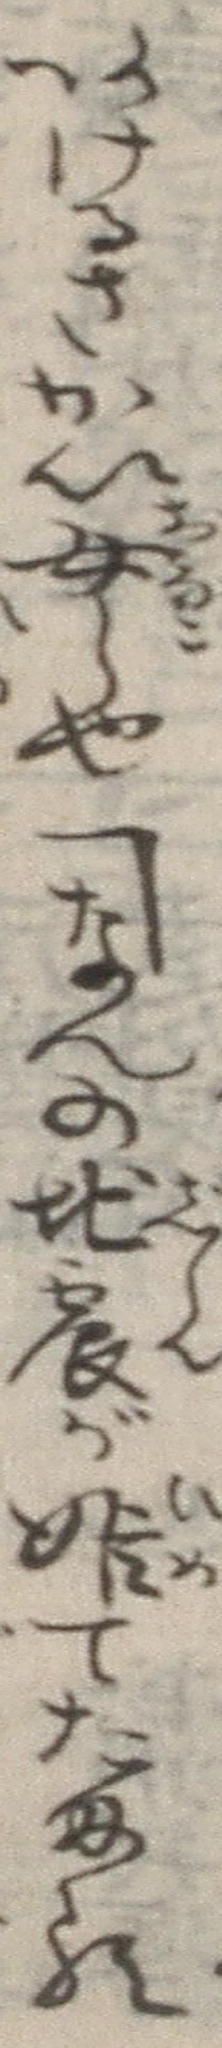あけるさかい女しや〽なんの地震が姫てたまる
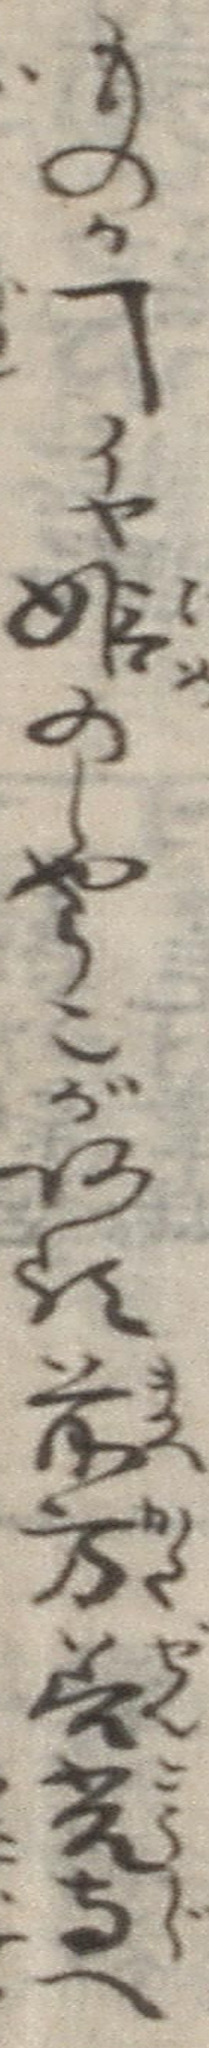ものか〽イヤ姫のしやうこがある前方善光寺へ
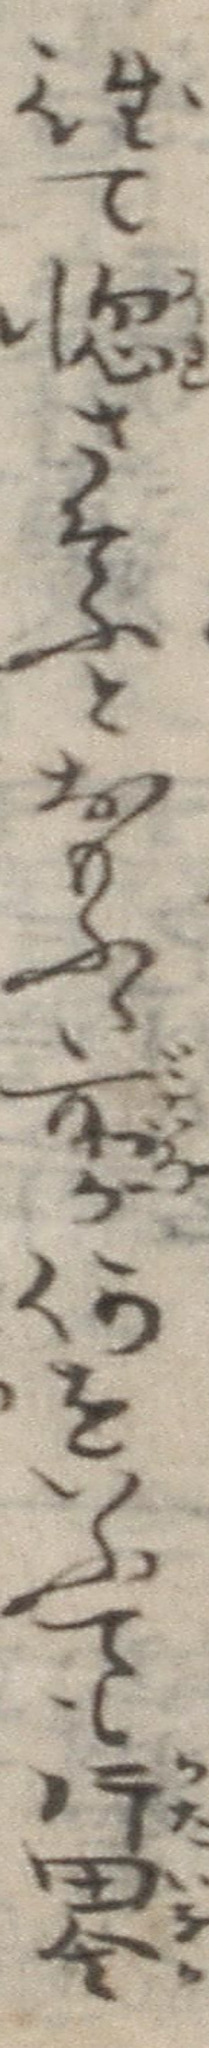往て惚さそふとおもふた所が何をいふても片田舎
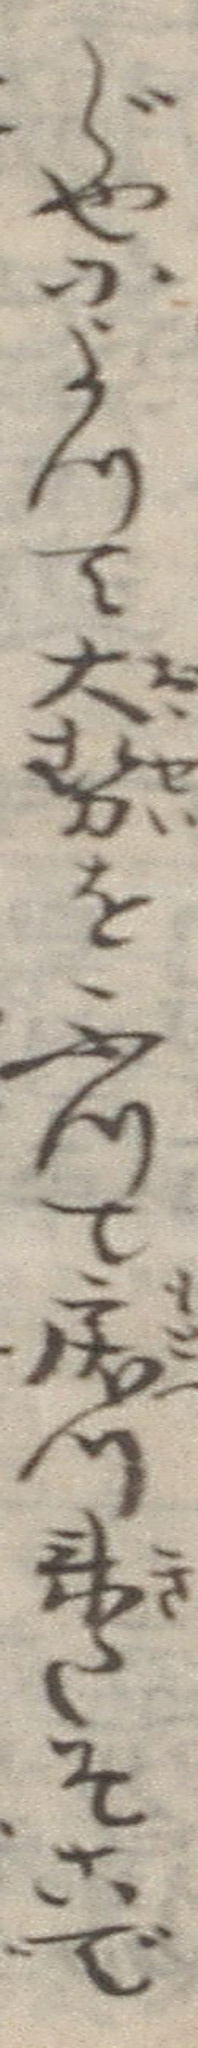じやによつて大勢をふつて戻つ来たそこで
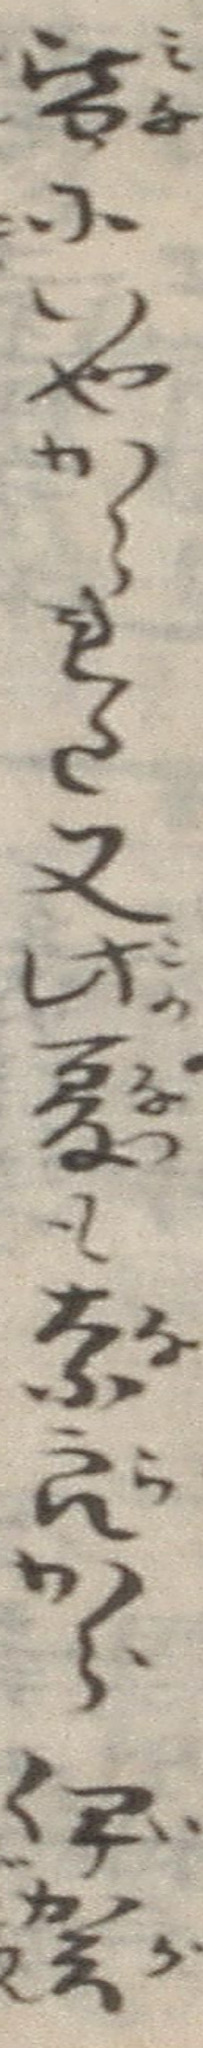皆にいやかられた又此夏も奈良から伊賀
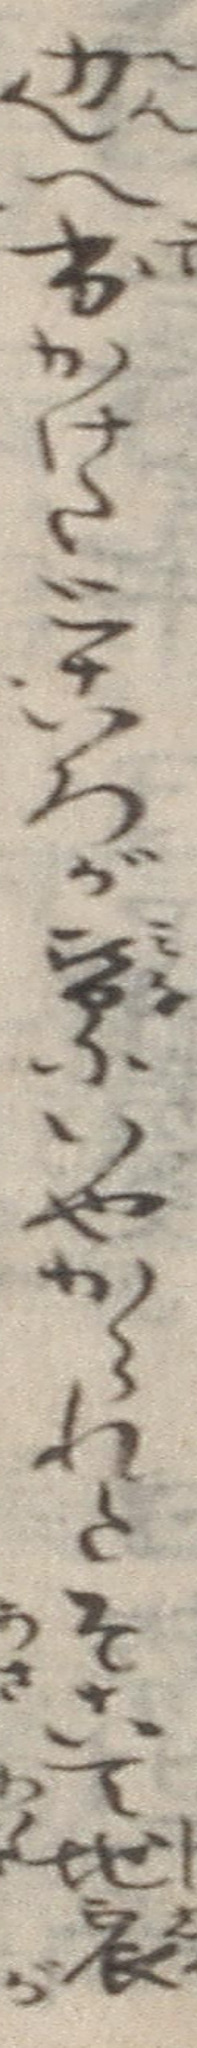辺へ出かけたところが皆にいやかられたそこて地震
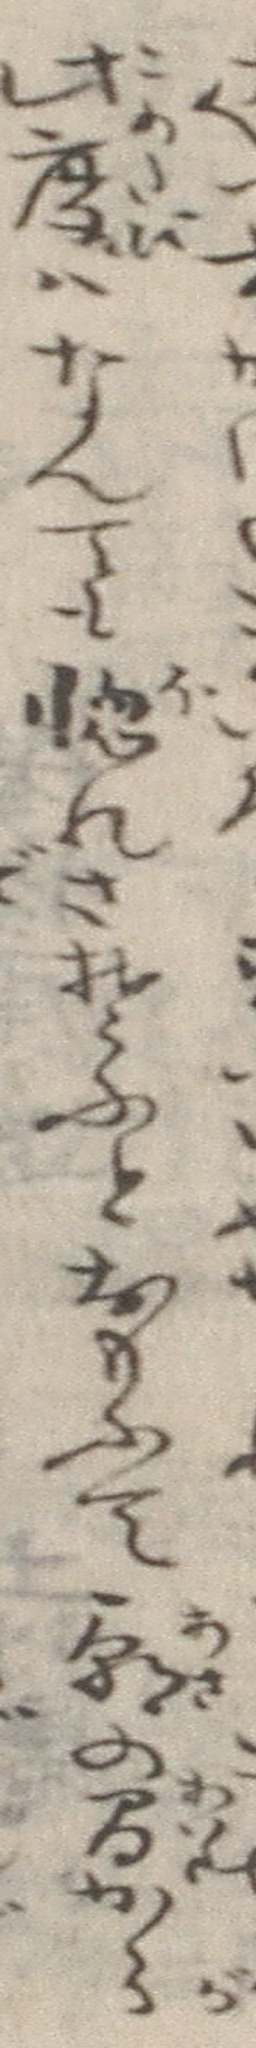此度はなんても惚れさそふとおもふて朝の間から
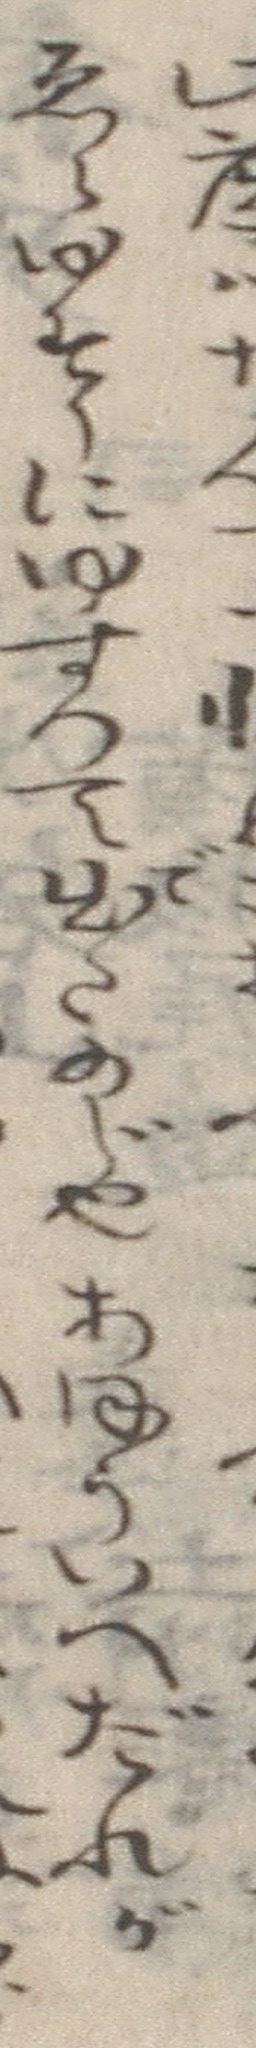ゑらゆすりにゆすつて出たのじやあほういへだれが
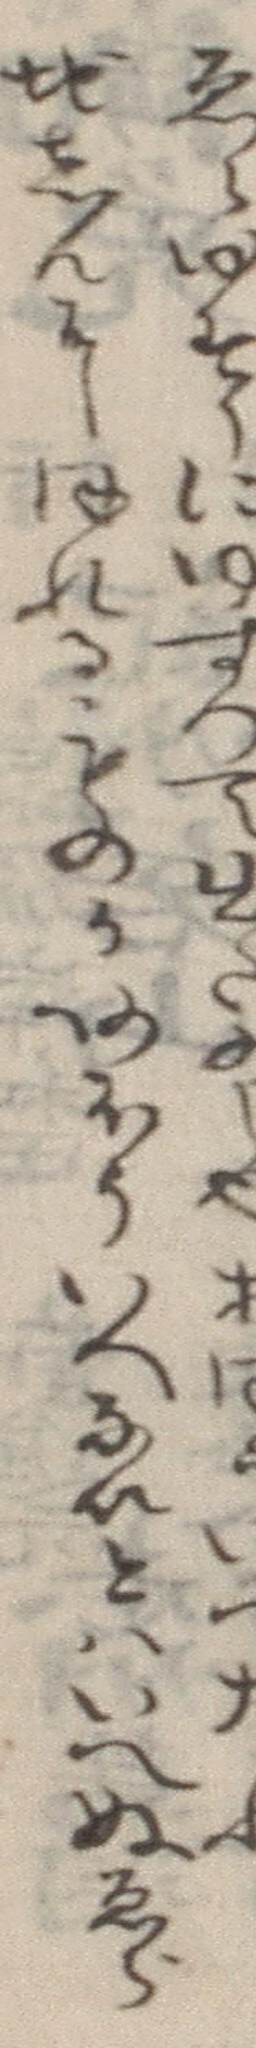地しんにほれるものかあほういへないとはいへぬゑら
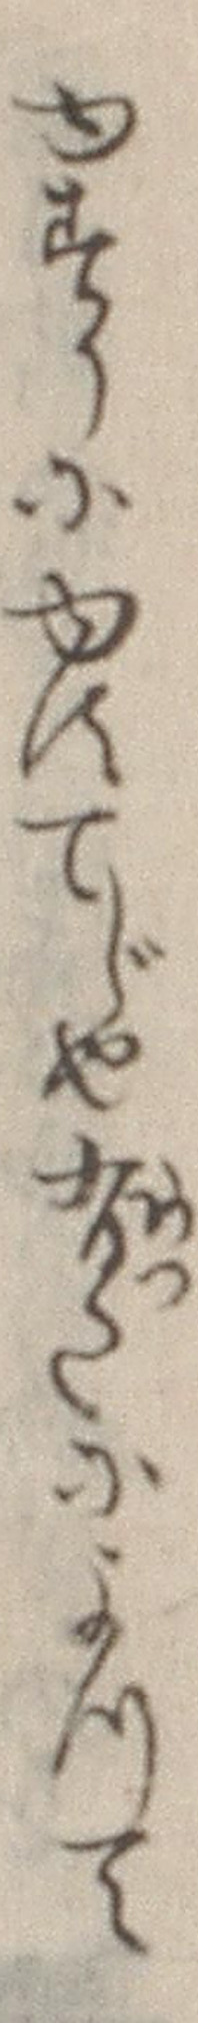ゆすりにゆつてじや有たによつて
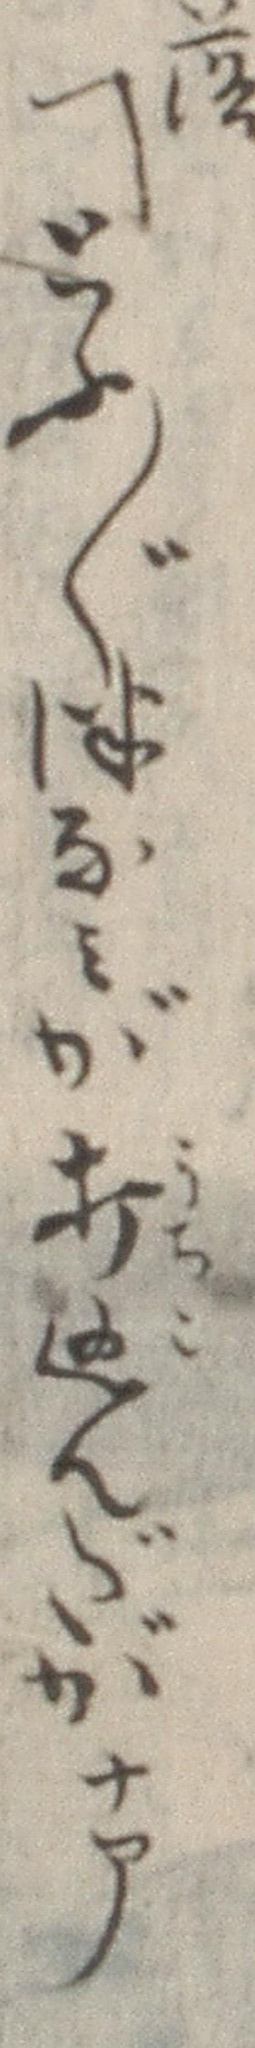落〽とふ〴〵津なみが打込んだがナア
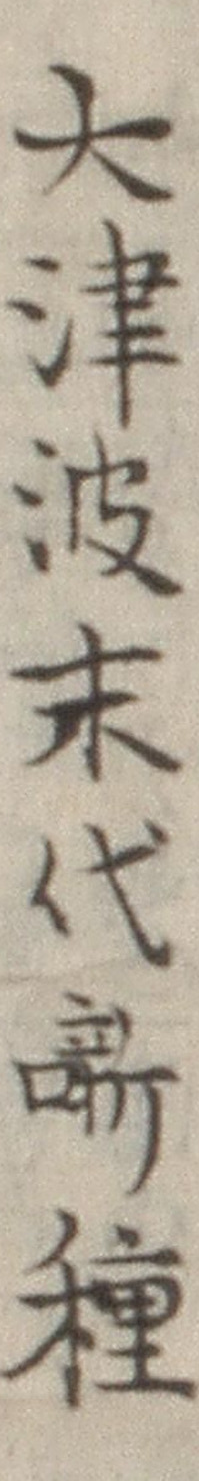大津波末代噺種
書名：諸國大地震年代記末代噺種
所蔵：東京大学地震研究所図書室 Earthquake Research Institute Library, The University of Tokyo, JAPAN
